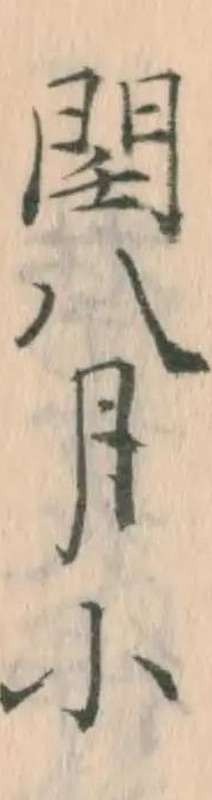閏八月小
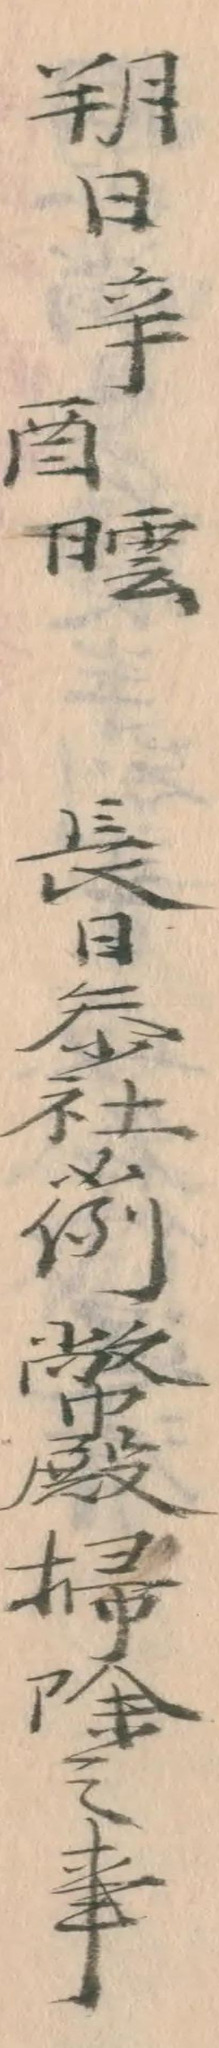朔日辛酉曇長日参社如例幣殿掃除之事
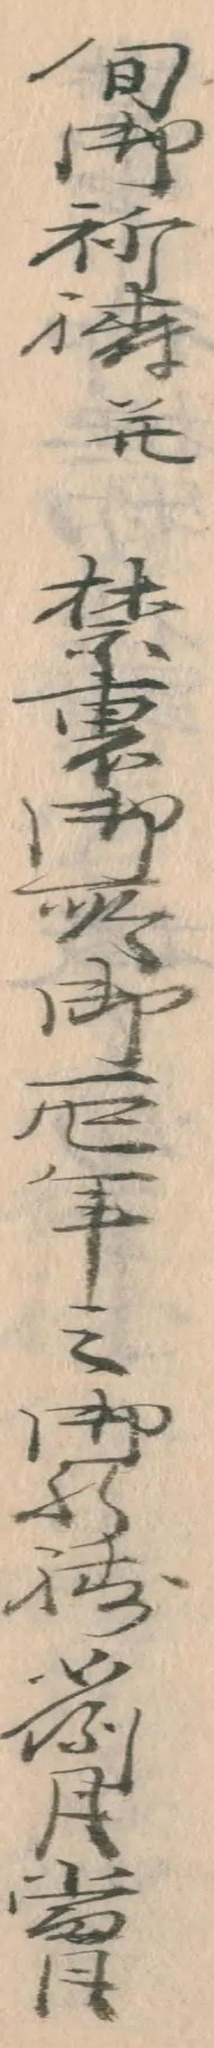一旬御祈祷并禁裏御所御厄年之御祈禱如例月當月
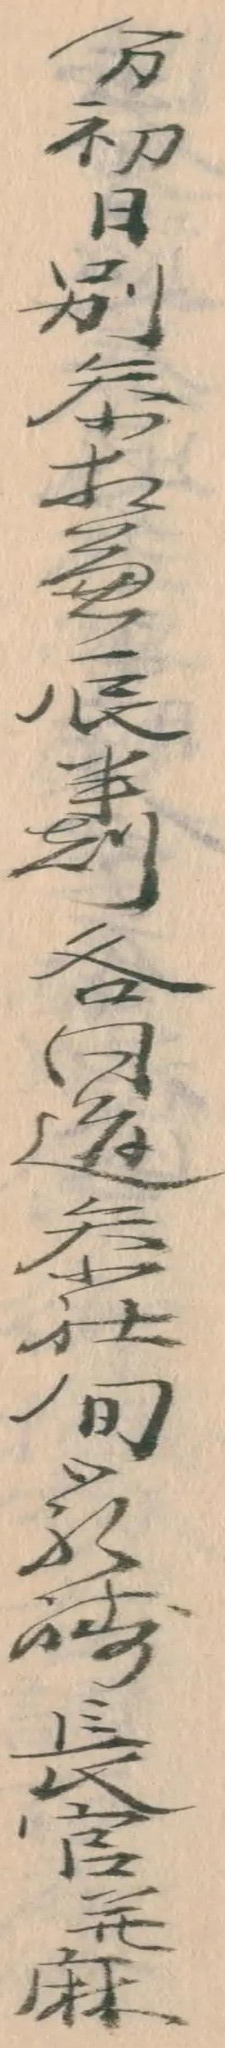分初日別参相兼辰半刻各同道参社旬御祈祷長官并麻
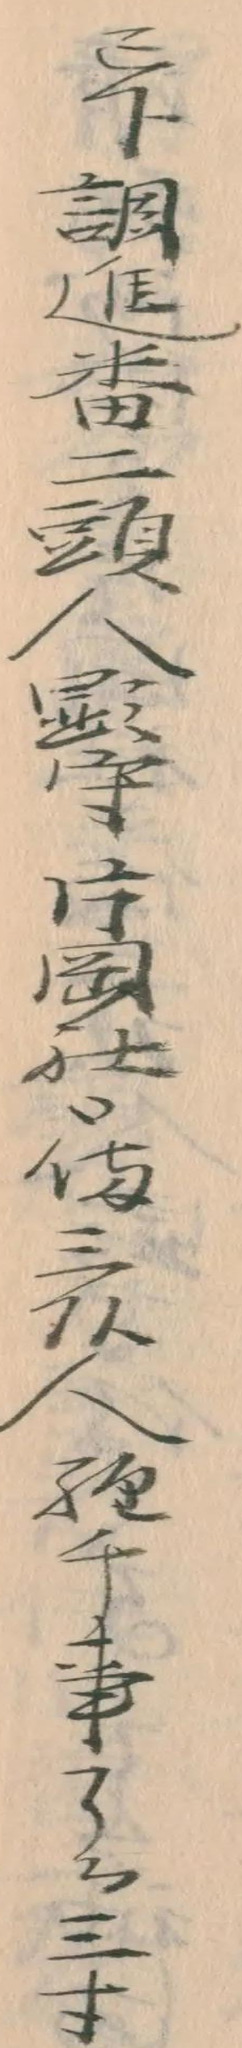已下調進番二頭人顕守片岡社御備三頭人経千事了而三寸
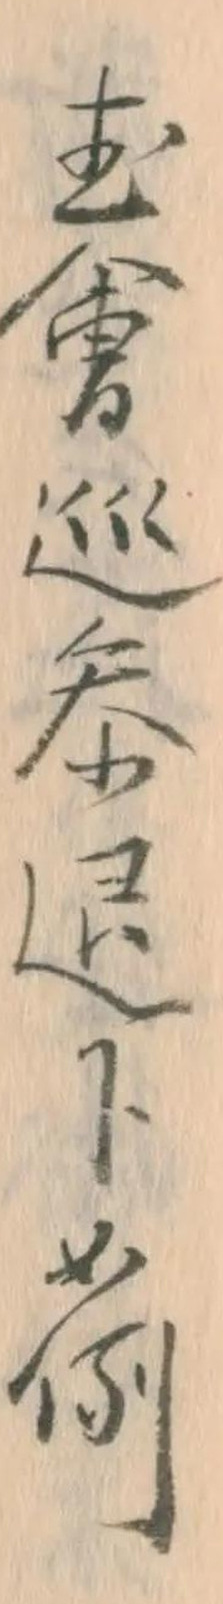直會巡参退下如例
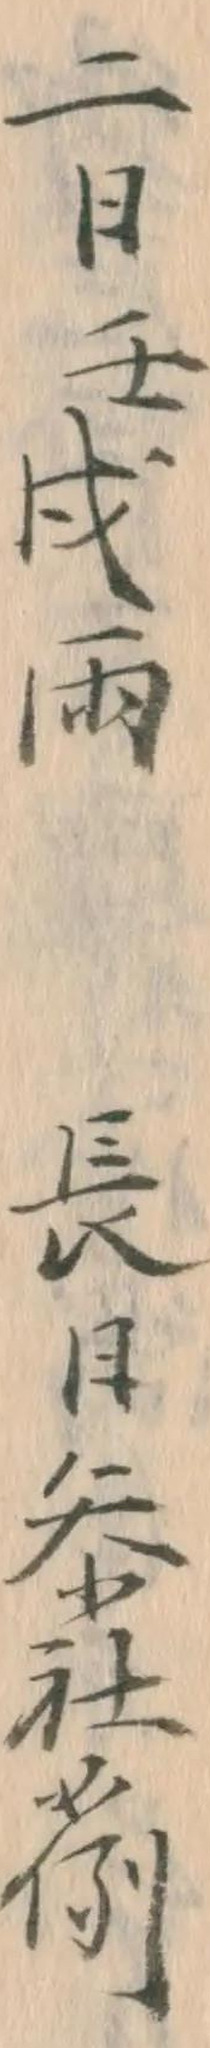二日壬戌雨長日参社如例
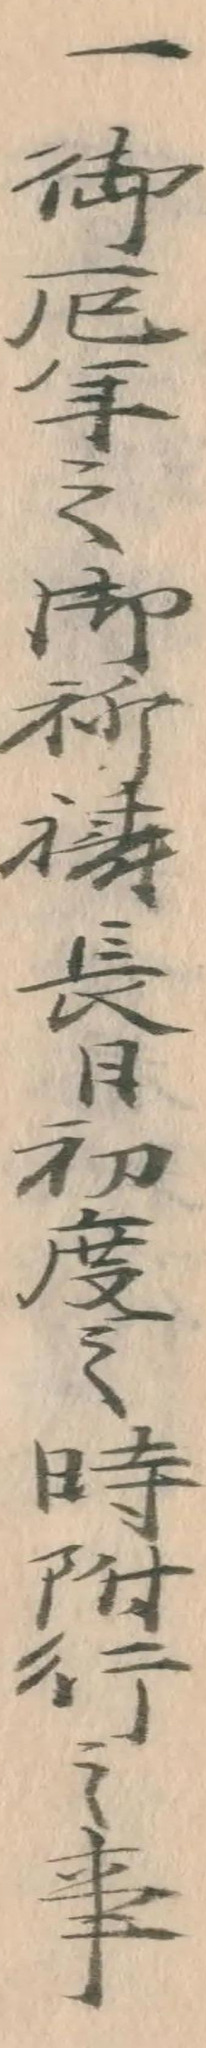一御厄年之御祈祷長日初度之時附行之事
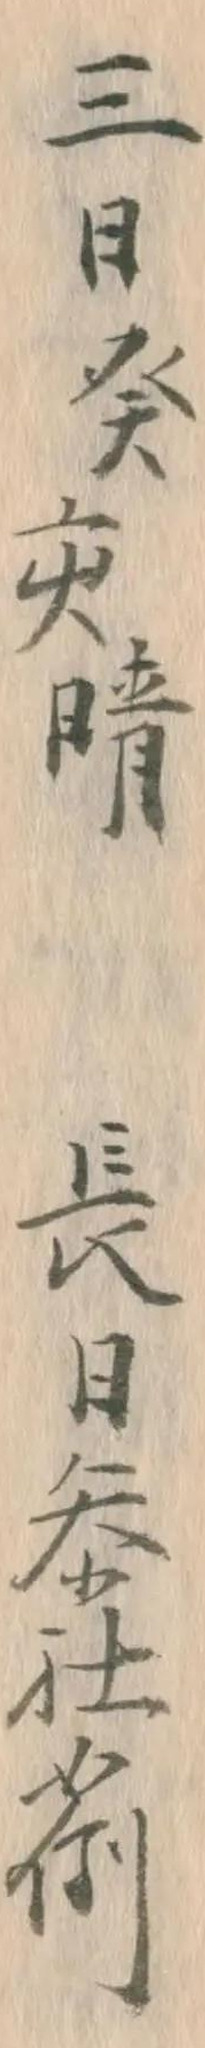三日癸亥晴長日参社如例
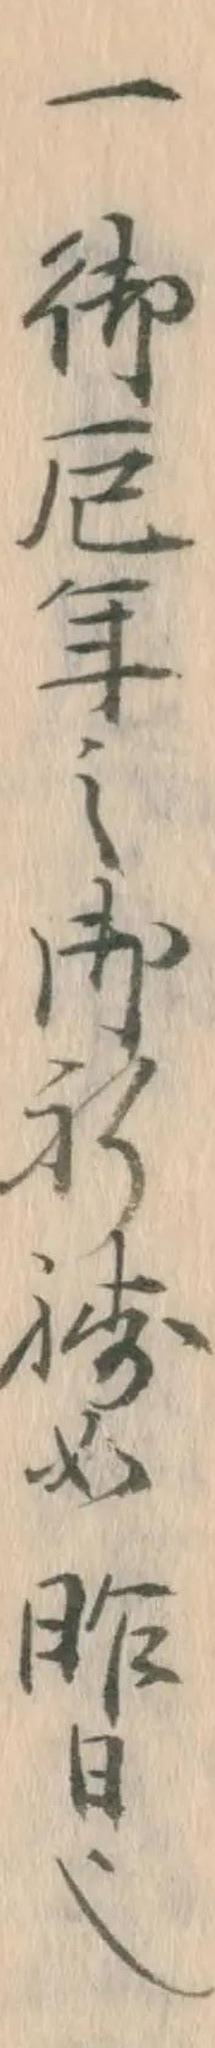一御厄年之御祈祷如昨日也
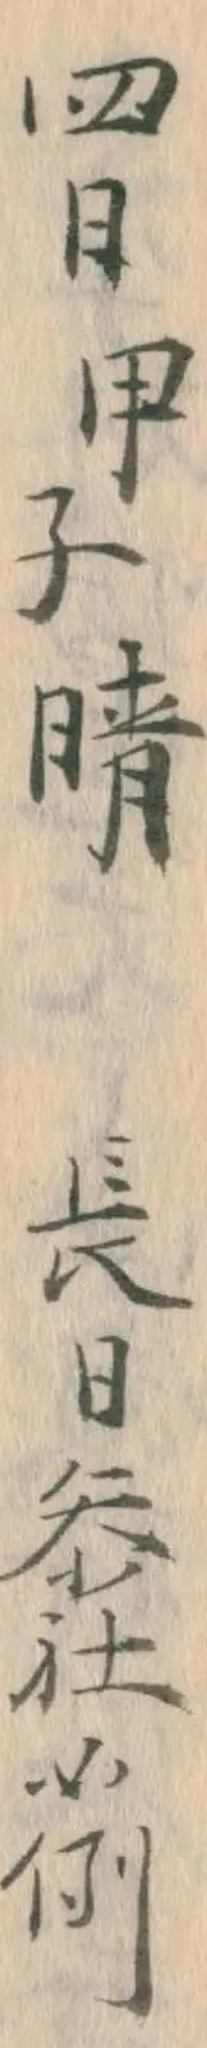四日甲子晴長日参社如例
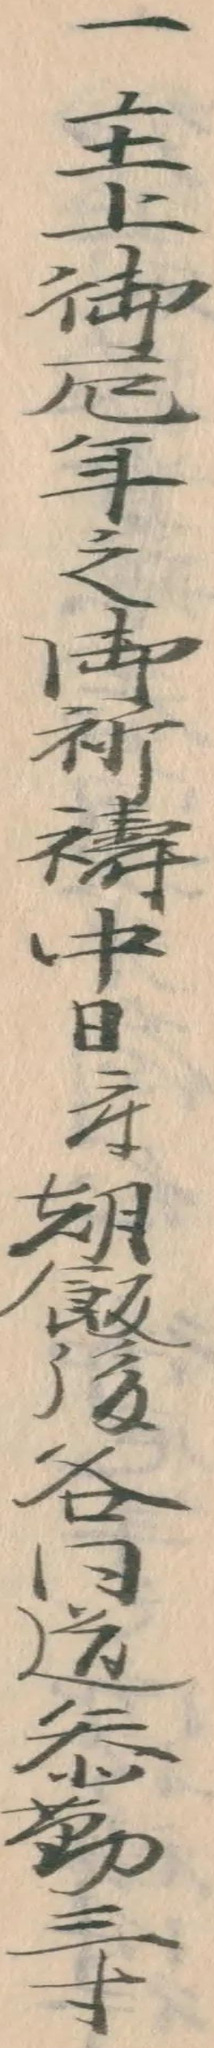一主上御厄年之御祈祷中日ニ付朝飯後各同道参勤三寸
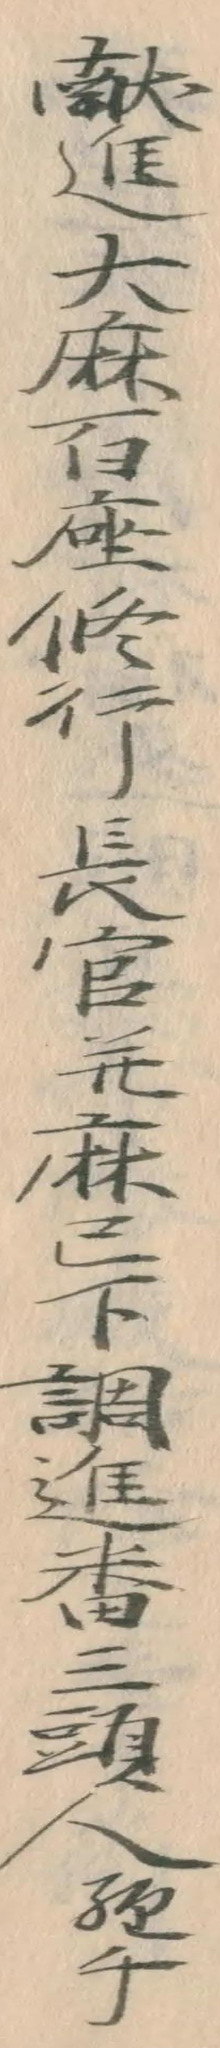献進大麻百座修行長官并麻已下調進番三頭人経千
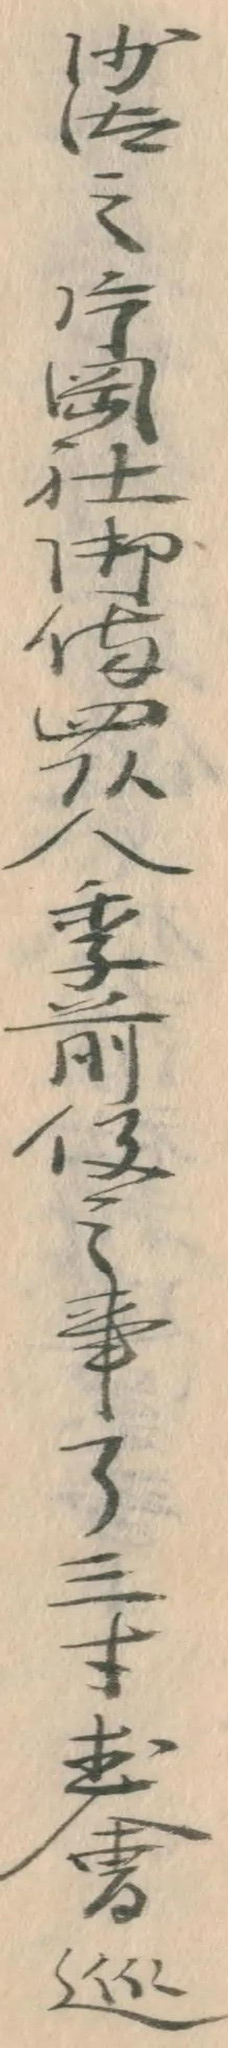沙汰之片岡社御備四頭人季前役之事了三寸直會巡
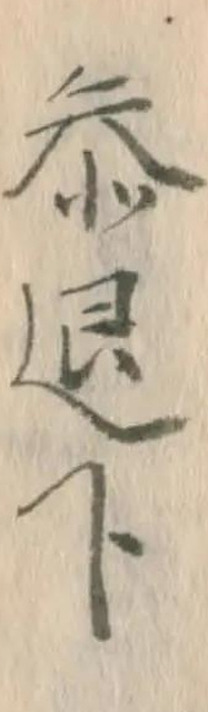参退下

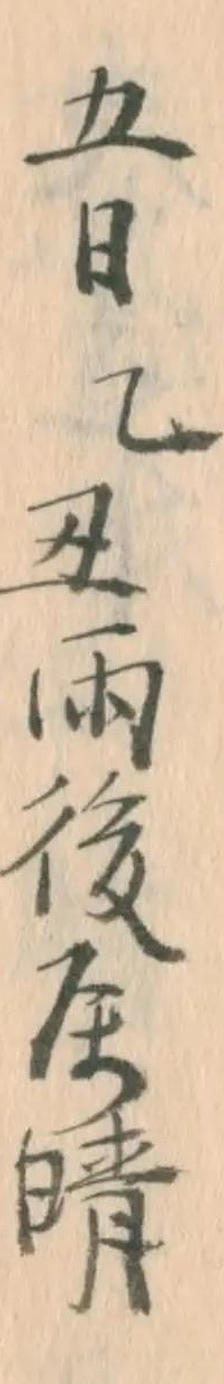五日乙丑雨後属晴
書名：賀茂社記録. 第73冊
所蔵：国立国会図書館 National Diet Library, JAPAN
